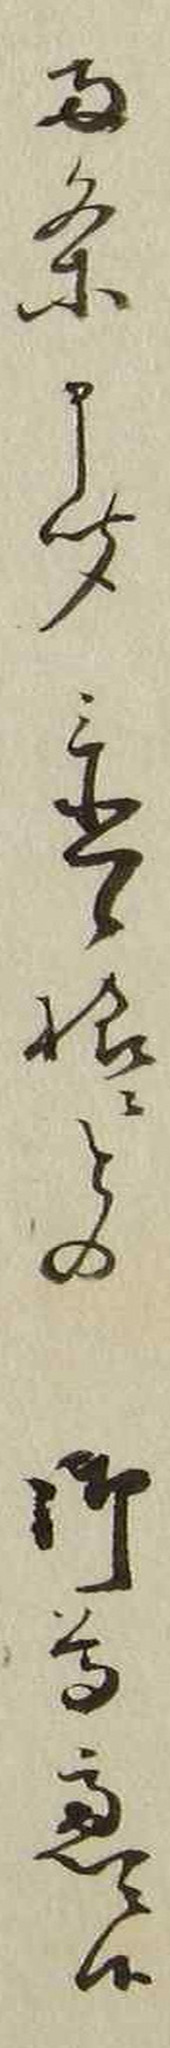両条申聞置候様にとの御尊慮に候
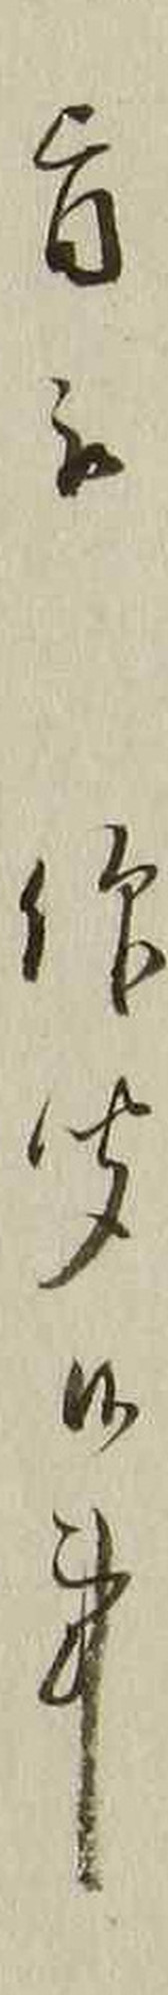旨被仰聞侯事
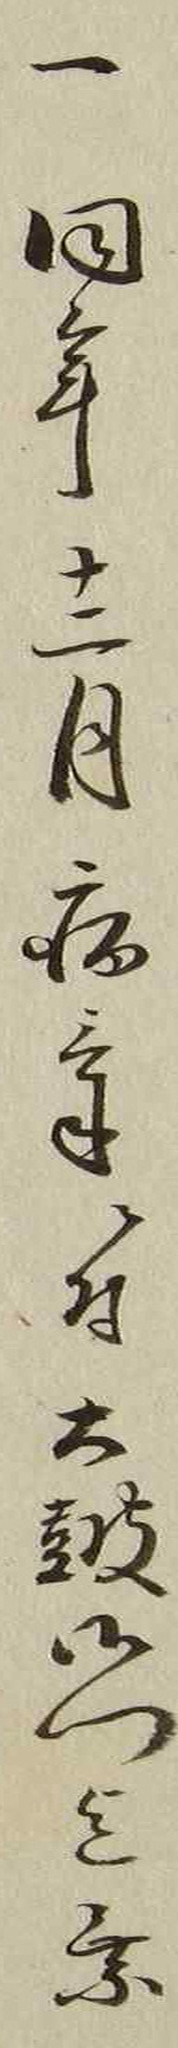一同年十二月病気候付大鼓御門迄乗
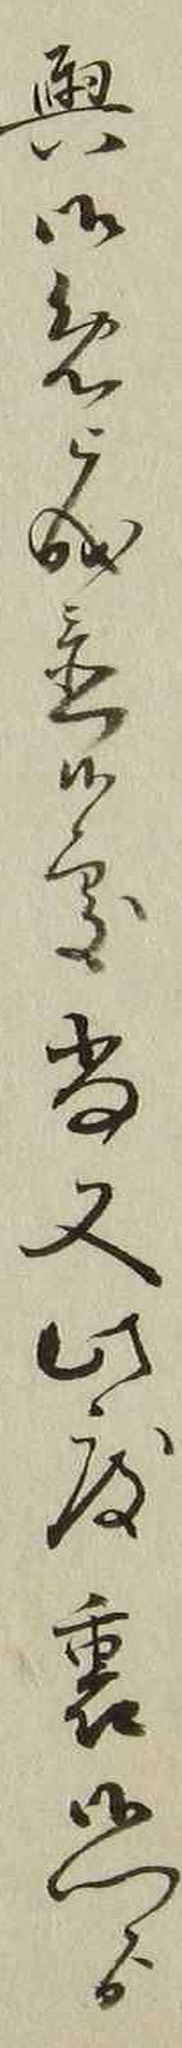興御免被成置候処尚又此度裏御門ゟ
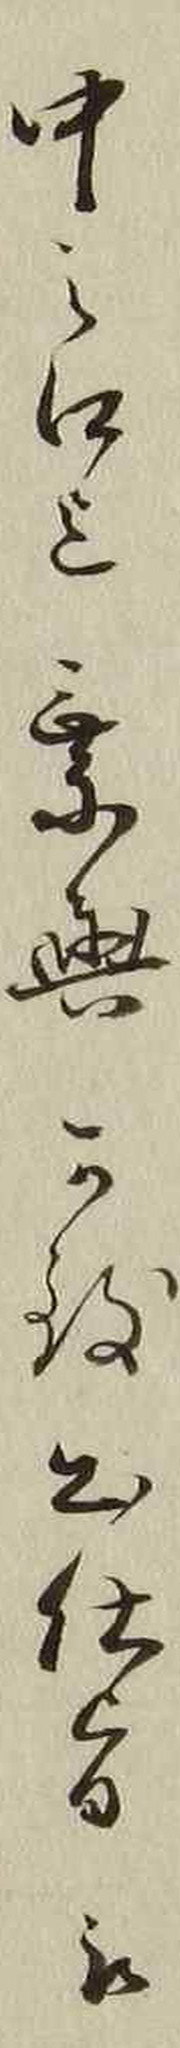中之口迄乗興可致出仕旨被
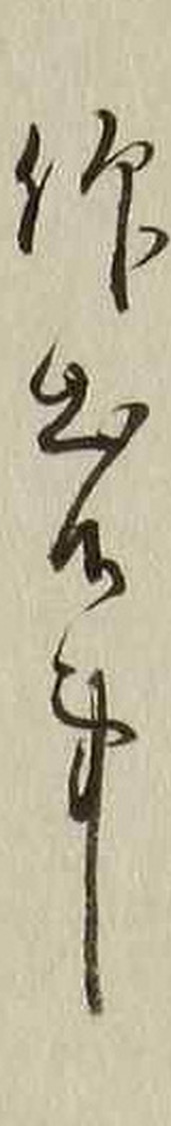仰出候事
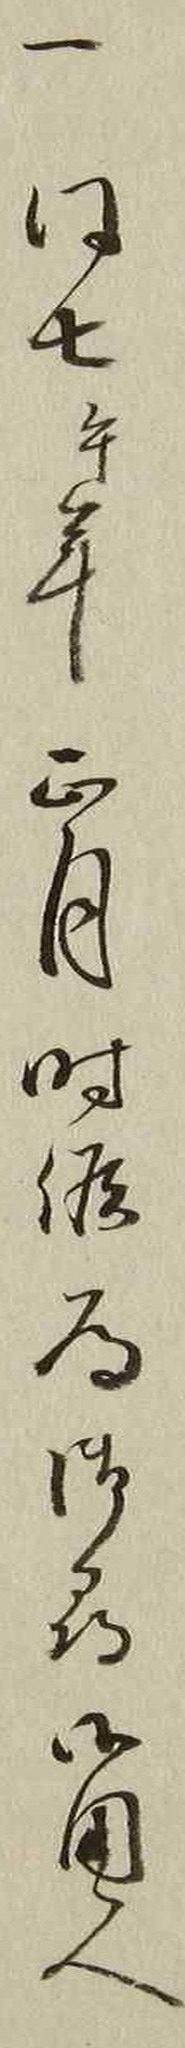一同七午年正月時候為御尋御用人
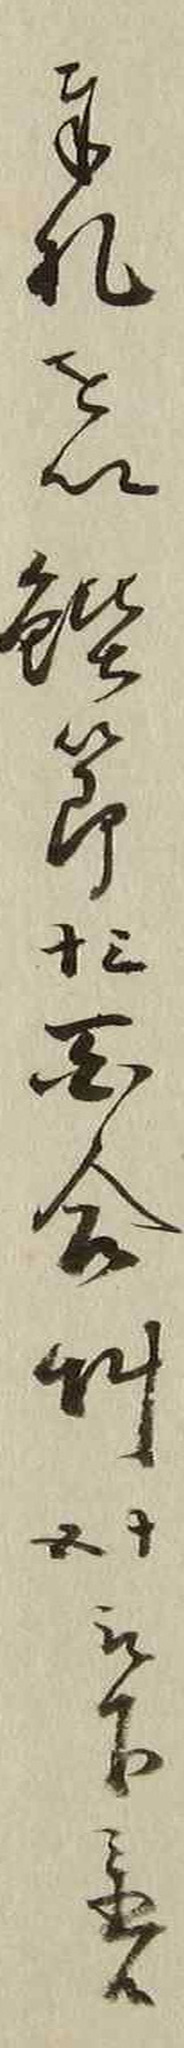奉札を以鰹節三十花合艸十五被下置候
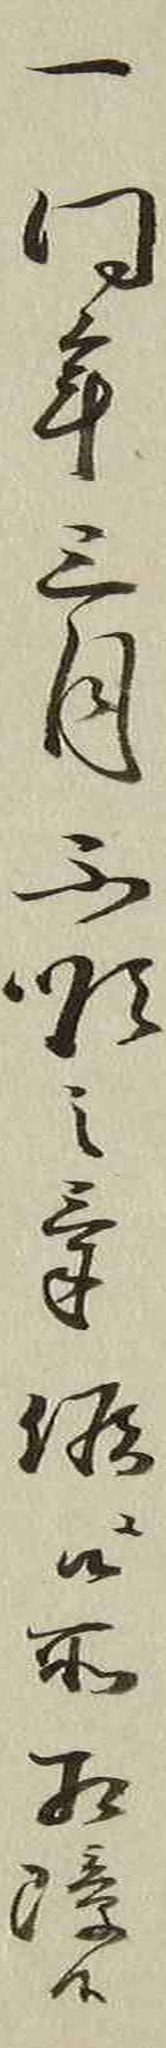一同年三月不順之気候に候所相障候
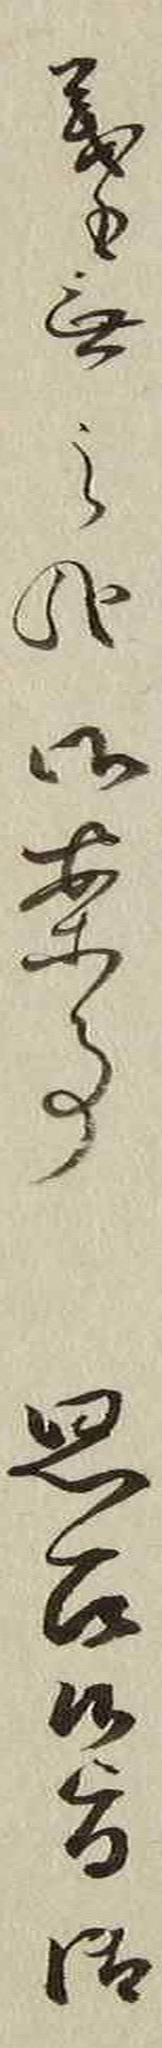義も無之哉御案事思召候旨御
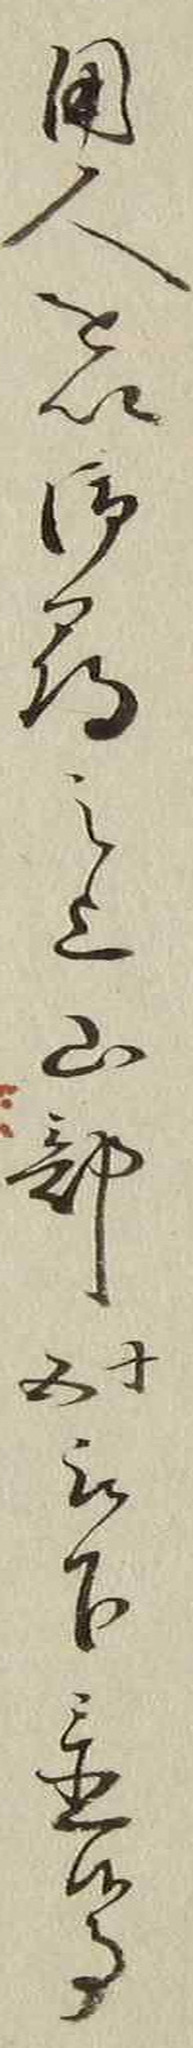用人を以御尋之上山部十五被下置候事
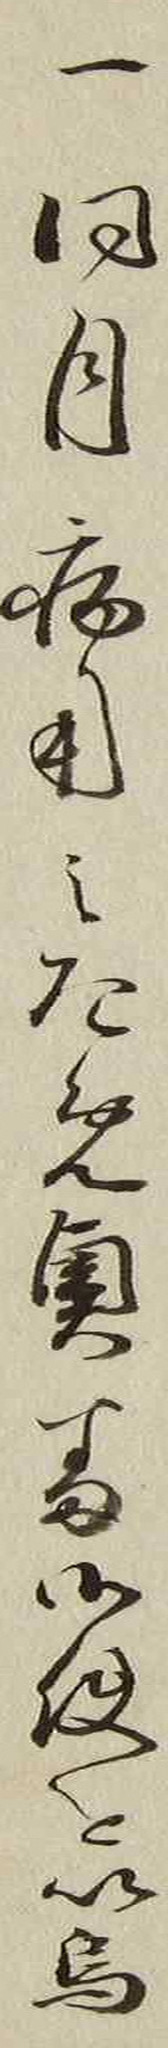一同月病用之ため奥番御使を以烏
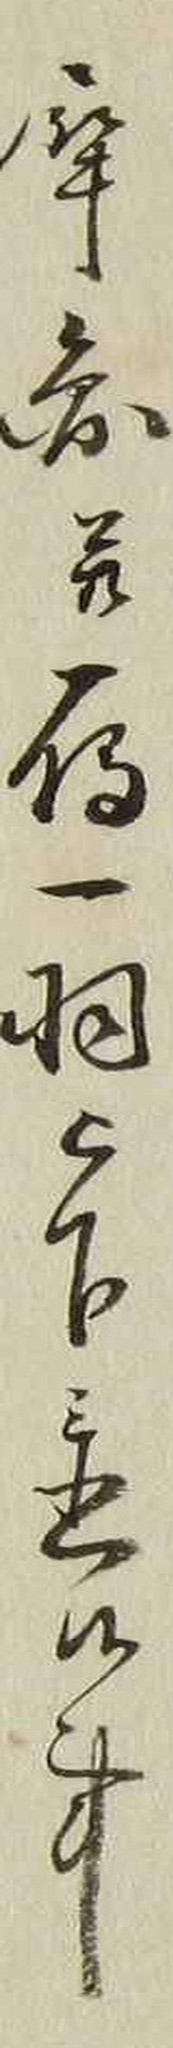犀円并雁一羽被下置候事
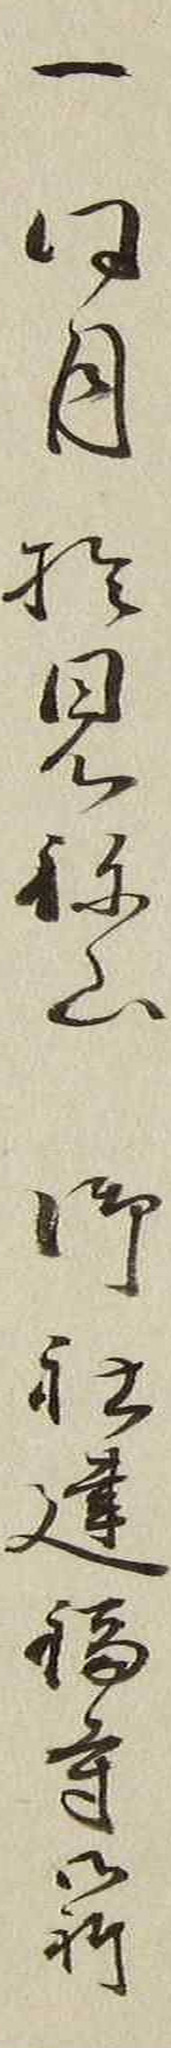一同月於見祢山御社建福寺御祈
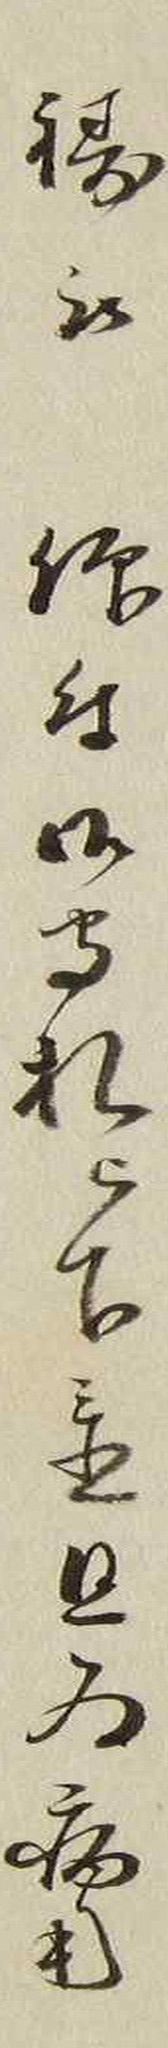祷被仰付御守札被下置旦為病用
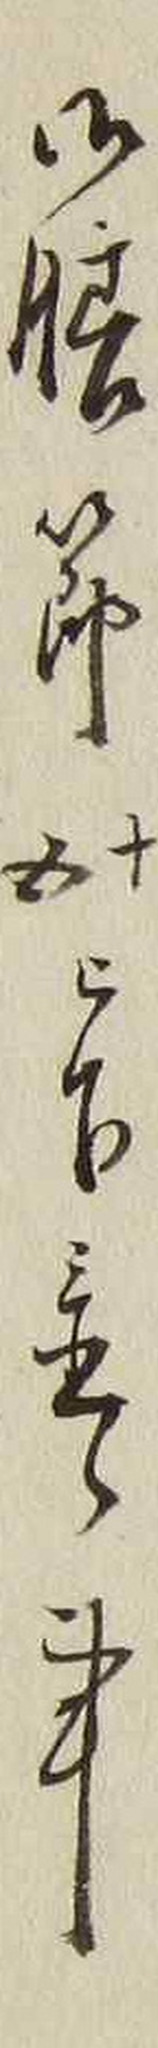御膳節十五被下置候事
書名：諸士系譜　巻之159　な之部1
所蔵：会津若松市立会津図書館
